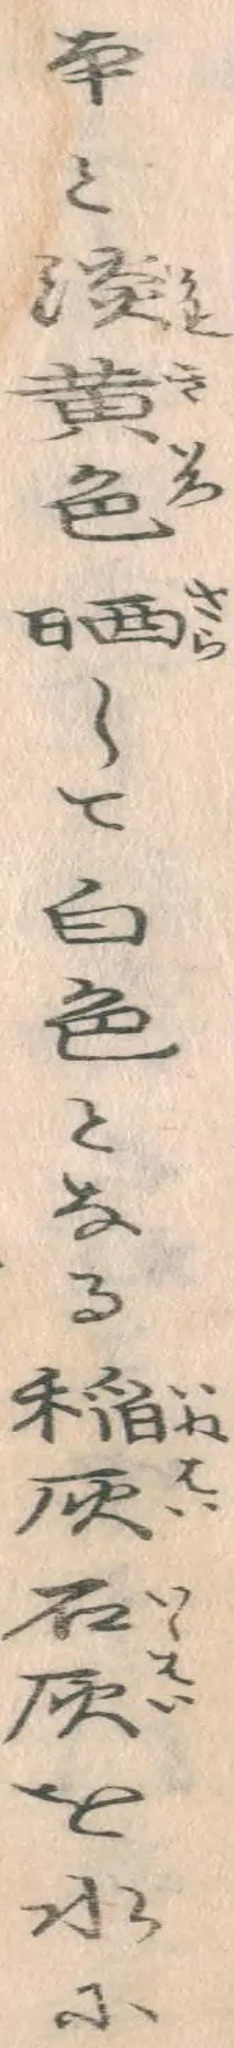本と淡黄色晒して白色となる稲灰石灰を水に
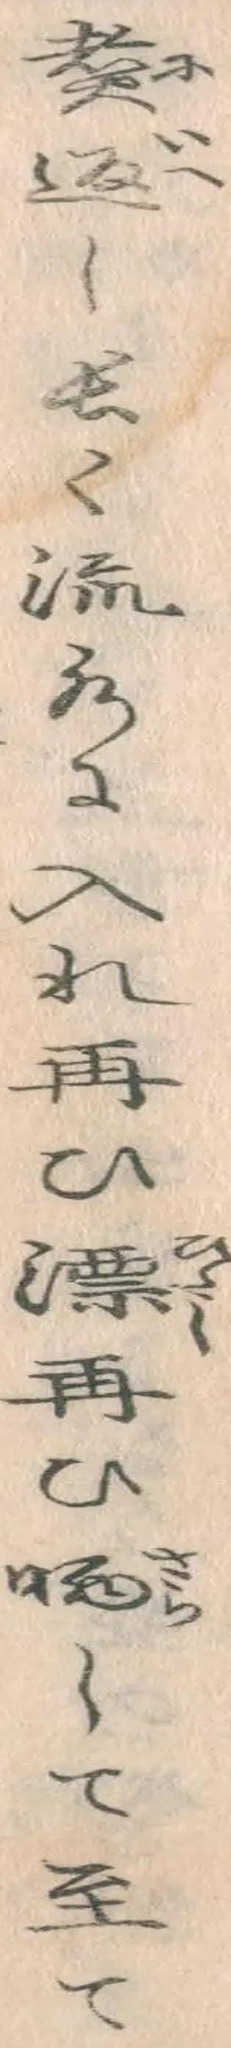煮返し長く流水に入れ再ひ漂再ひ晒して至て
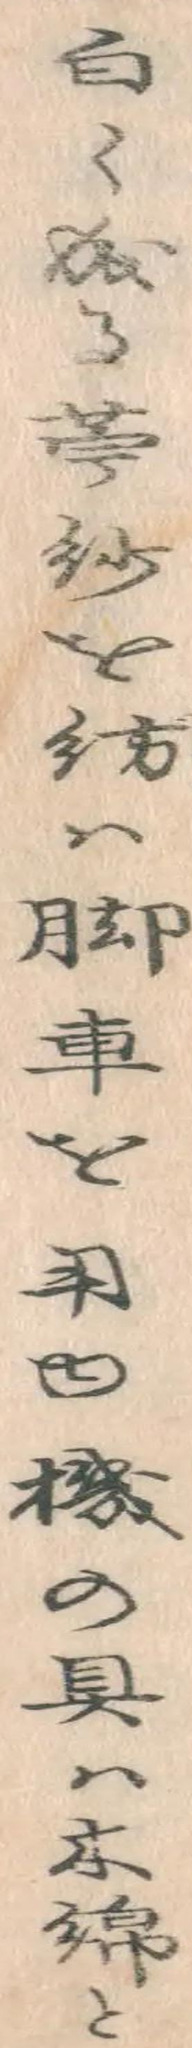白く成る苧紗を紡は脚車を用ゆ機の具は木綿と

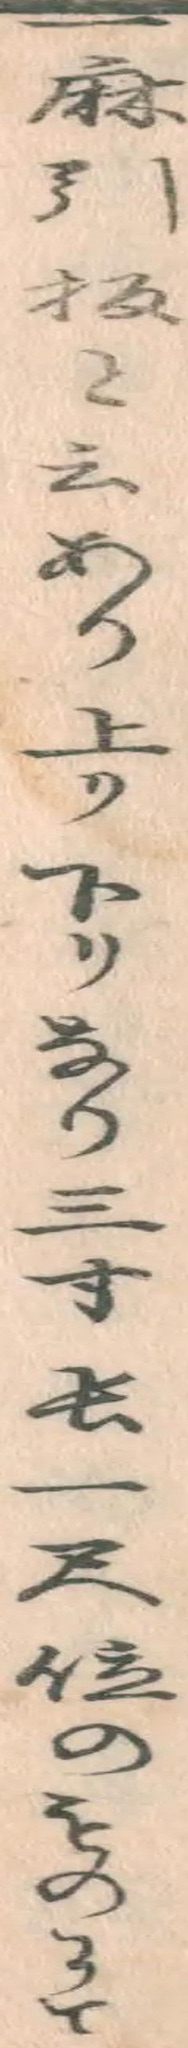一麻引板と云あり上り下りなり三寸長一尺位のものにて
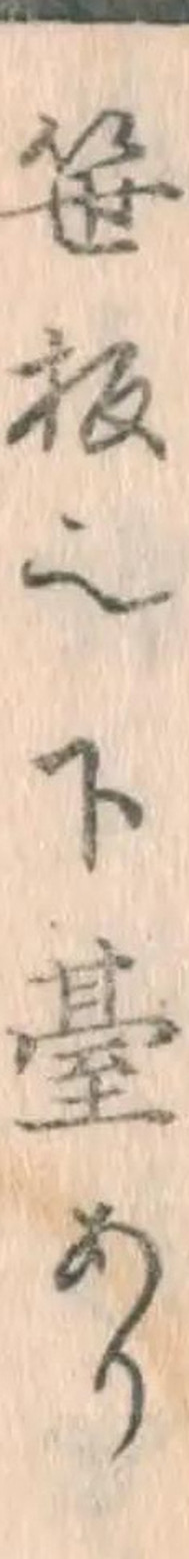笹板也下台あり
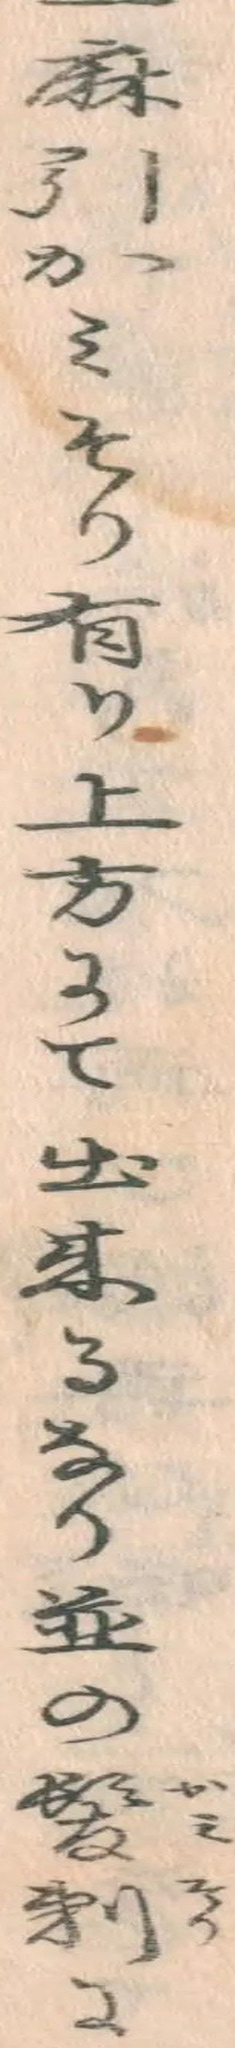一麻引かみそり有り上方にて出来るなり並の髪剃に
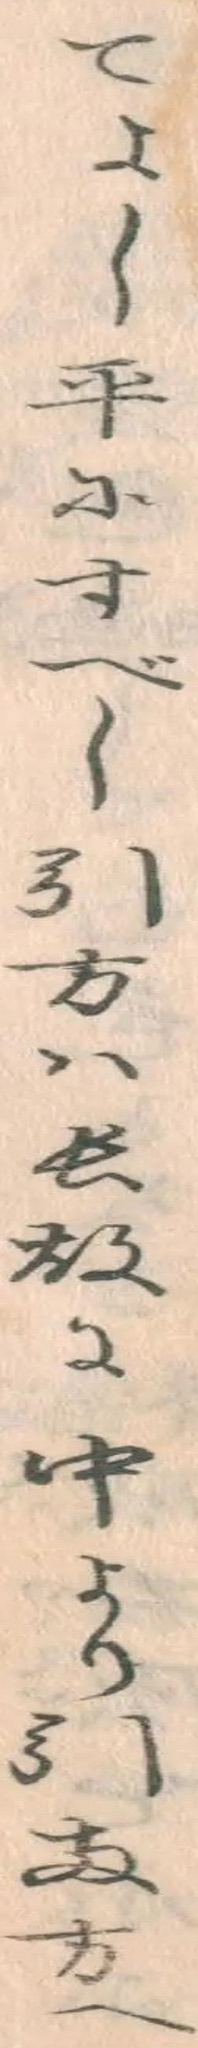てよし平にすべし引方は長故に中より引両方へ
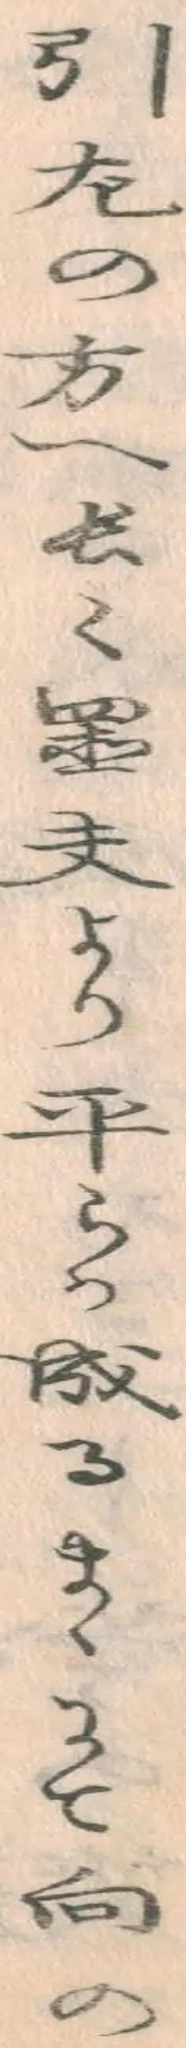引左の方へ長く置夫より平らか成るまゝにて向の
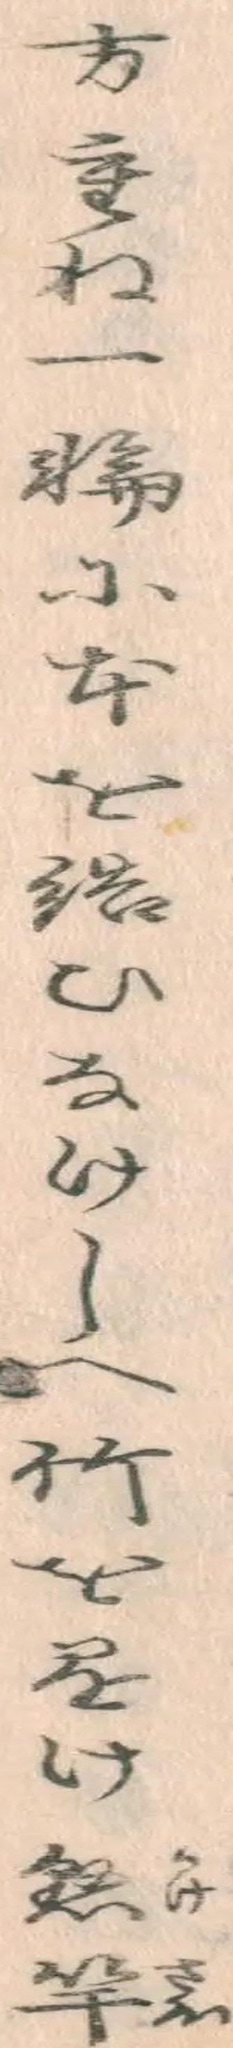方重ね一輪に本を結ひなけしへ竹を懸け懸竿
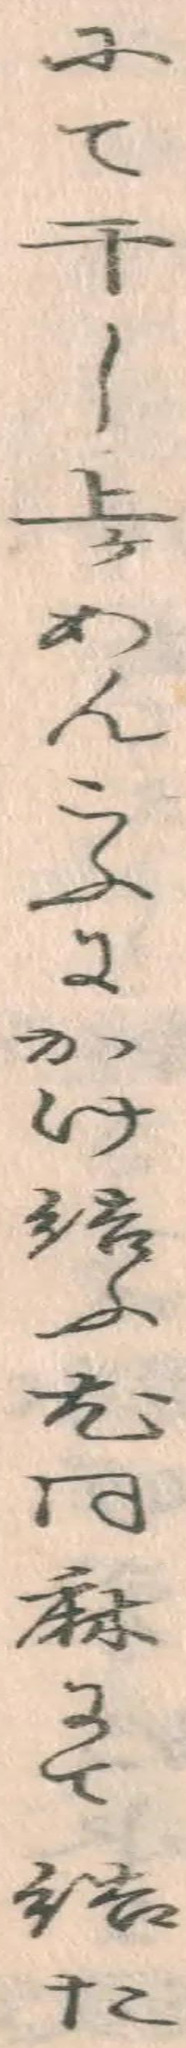にて干し上ヶあんこふにかけ結ふ尤同麻にて結た
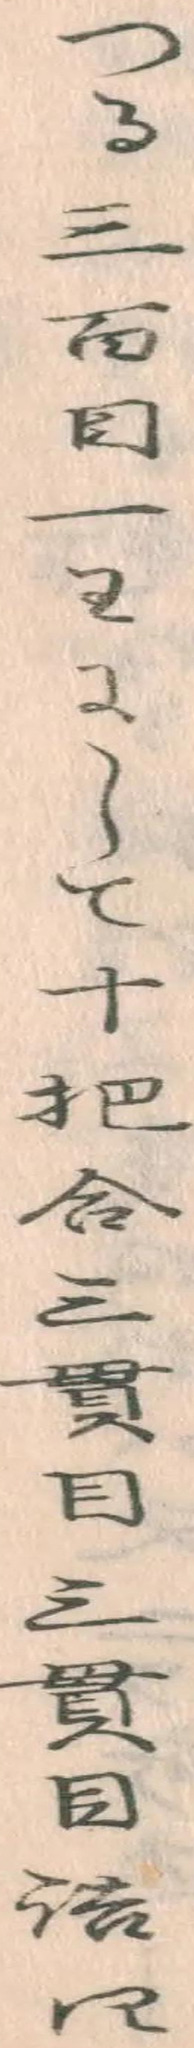つる三百目一わにして十把合三貫目三貫目詰四
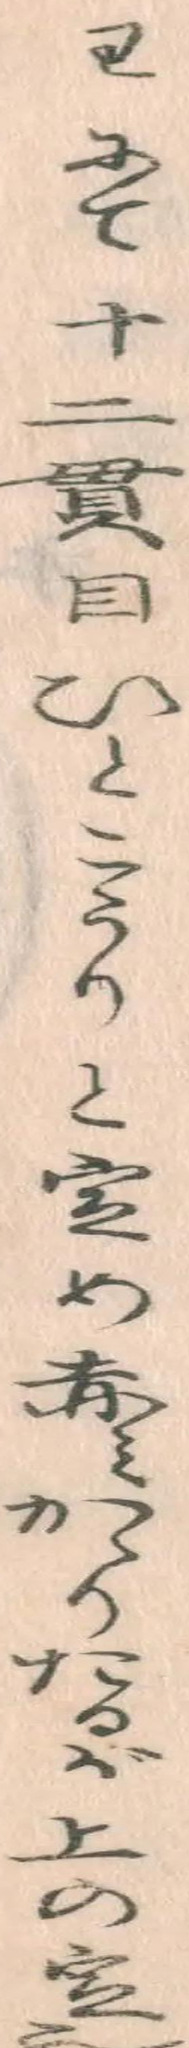わにて十二貫目ひとこうりと定め赤みかゝりたるが上の定也
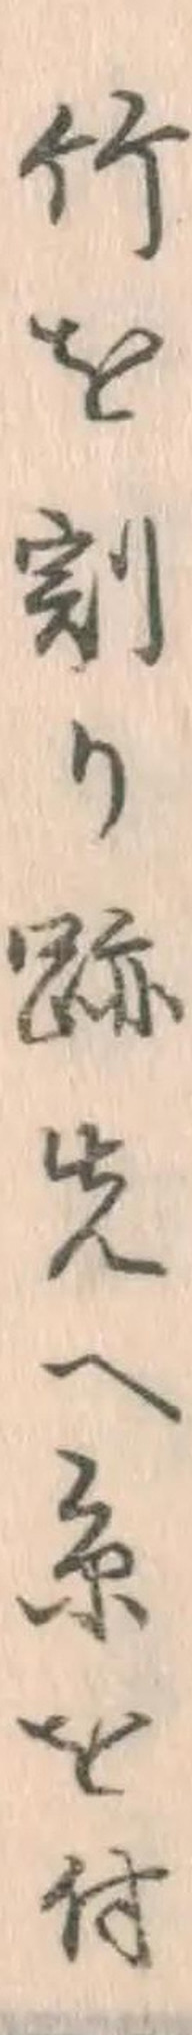竹を割り跡先へ糸を付
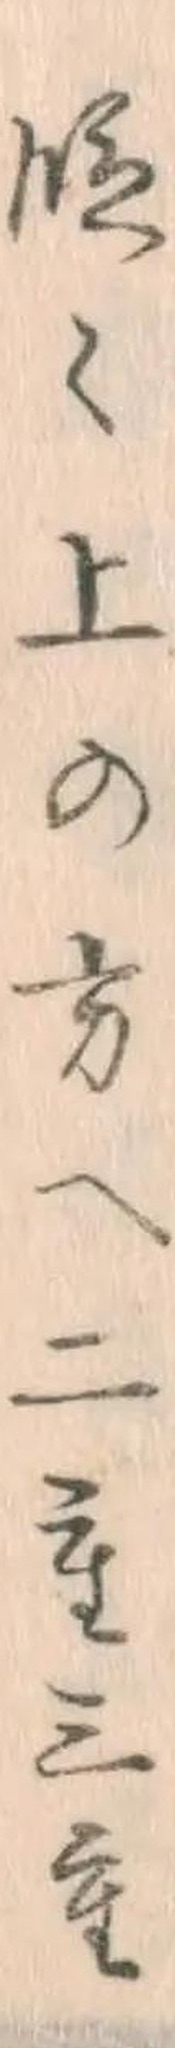段々上の方へ二重三重
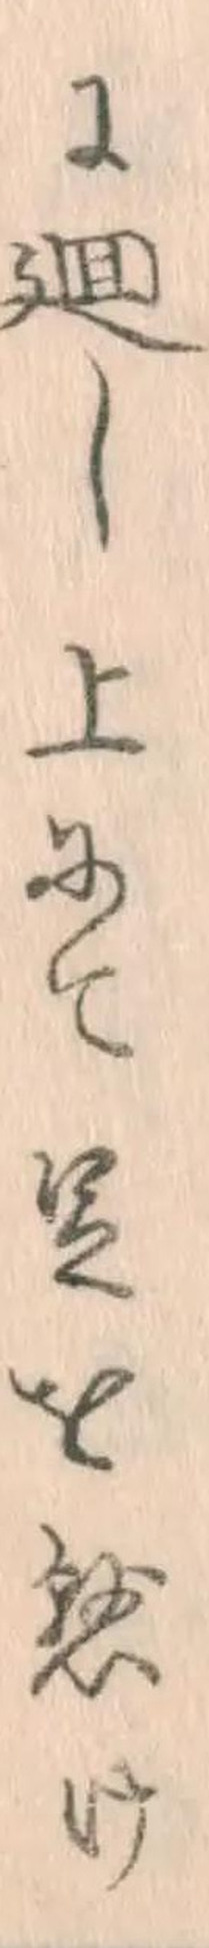に廻し上にて足を懸け
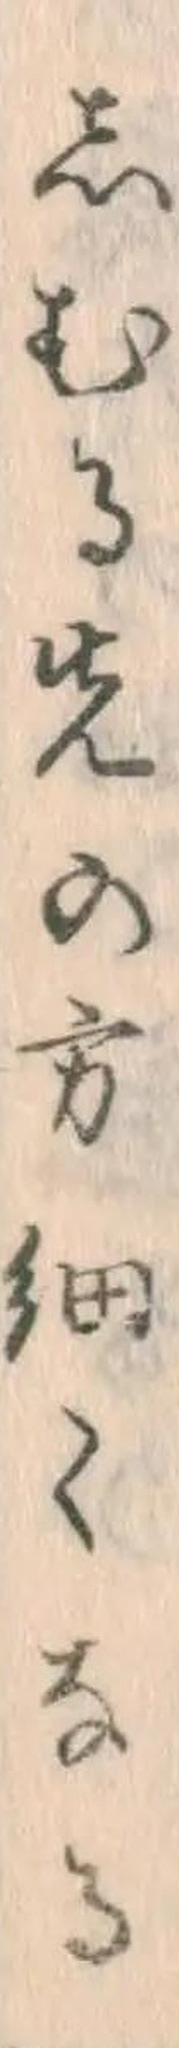しむる先の方細くなる
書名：機織彙編 5巻. [1]
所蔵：国立国会図書館 National Diet Library, JAPAN
